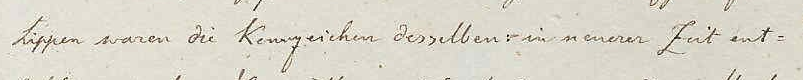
Lippen waren die Kennzeichen desselben: in neuerer Zeit ent-
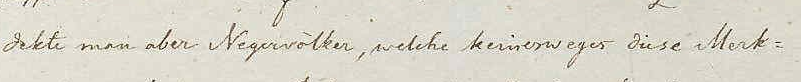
dekte man aber Negervölker, welche keinesweges diese Merk-
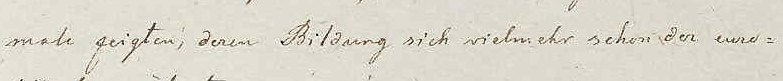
male zeigten, deren Bildung sich vielmehr schon der euro-
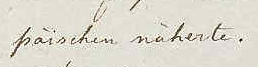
päischen näherte.
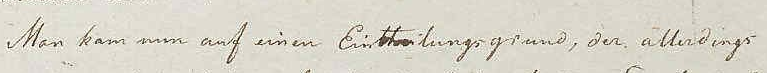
Man kam nun auf einen Eintheilungsgrund, der allerdings
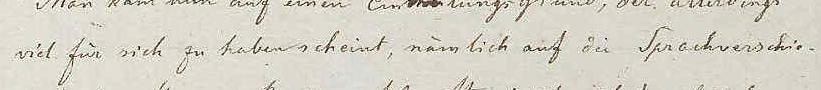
viel für sich zu haben scheint, nämlich auf die Sprachverschie-
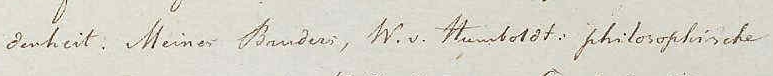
denheit. Meines Bruders, W. v. Humboldt: philosophische
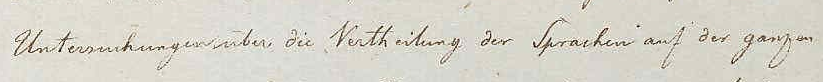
Untersuchungen über die Vertheilung der Sprachen auf der ganzen
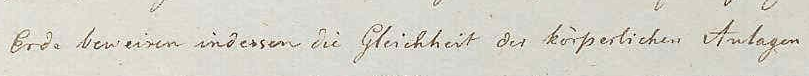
Erde beweisen indessen die Gleichheit der körperlichen Anlagen
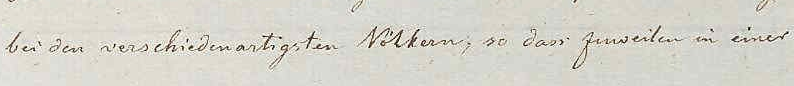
bei den verschiedenartigen Völkern, so dass zuweilen in einer
